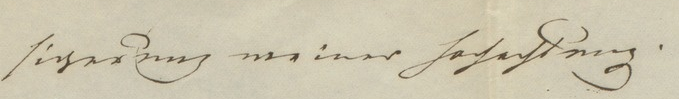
sicherung meiner Hochachtung.
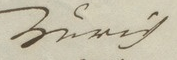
Zürich
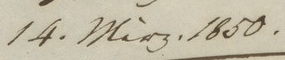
14. März. 1850.
